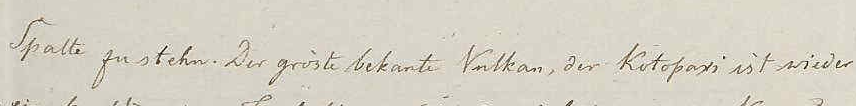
Spalte zu stehn. Der gröste bekante Vulkan, der Kotopaxi ist wieder
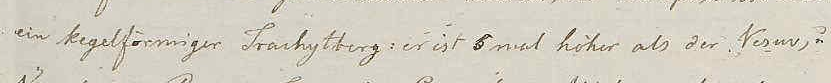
ein kegelförmiger Trachytberg: er ist 35 mal höher als der Vesuv, u
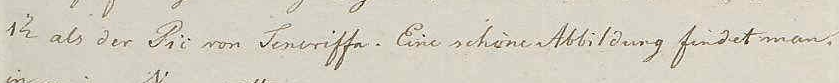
1½ als der Pic von Teneriffa. Eine schöne Abbildung findet man
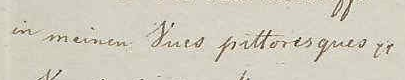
in meinen Vues pittoresques pp.
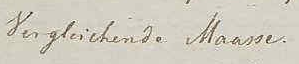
Vergleichende Maase.
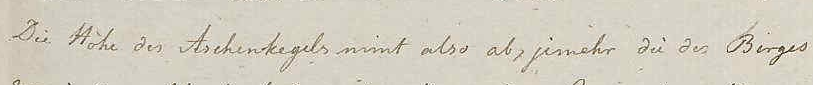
Die Höhe des Aschenkegels nimt also ab, jemehr die des Berges
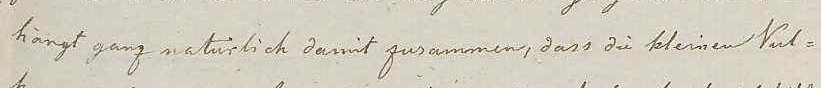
hängt ganz natürlich damit zusammen, dass die kleinen Vul-
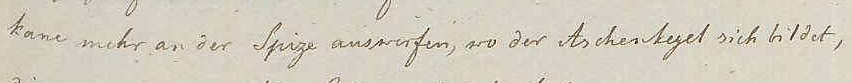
kane mehr an der Spize auswerfen, wo der Aschenkegel sich bildet,
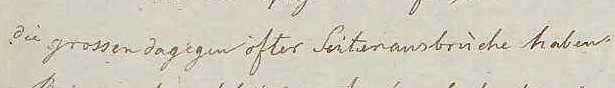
die grossen dagegen öfter Seitenausbrüche haben.
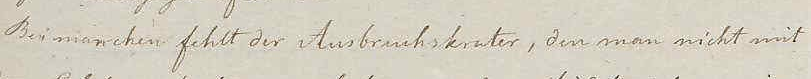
Bei manchen fehlt der Ausbruchskrater, den man nicht mit
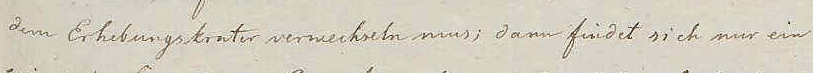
dem Erhebungskrater verwechseln mus; dann findet sich nur ein
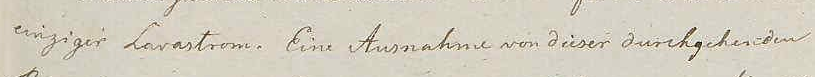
einziger Lavastrom. Eine Ausnahme von dieser durchgehenden
